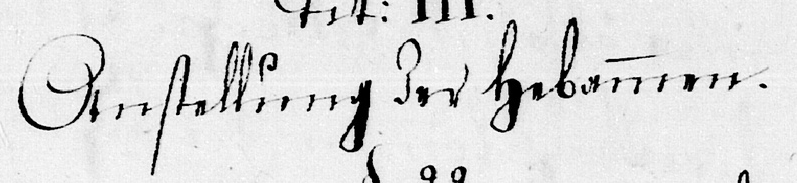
Anstellung der Hebammen.
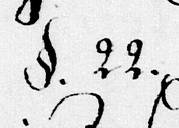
§. 22.
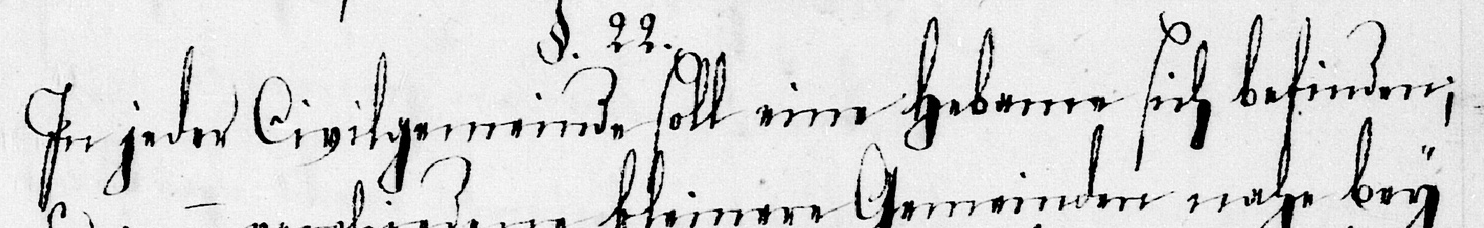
In jeder Civilgemeinde soll eine Hebamme sich befinden;
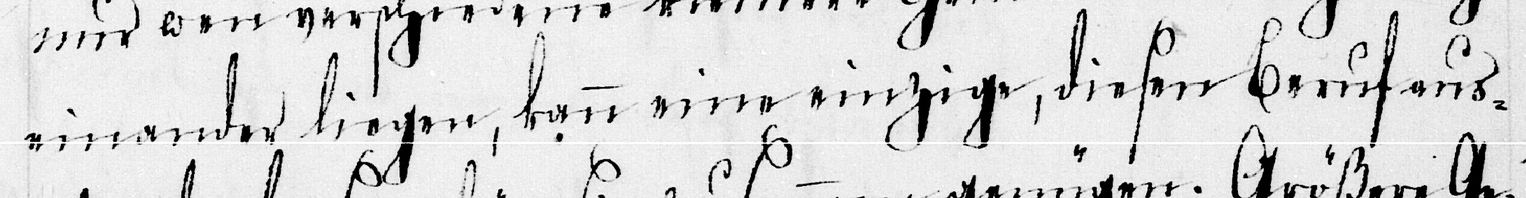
einander liegen, kann eine einzige, diesen Beruf aus¬
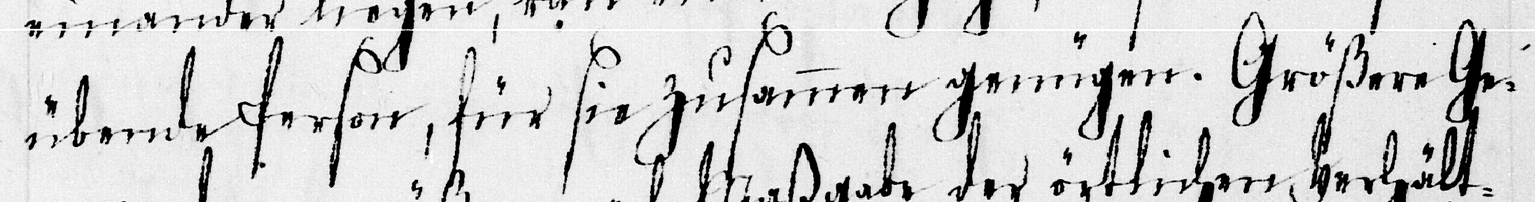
übende Person, für sie zusammen genügen. Größere Ge¬
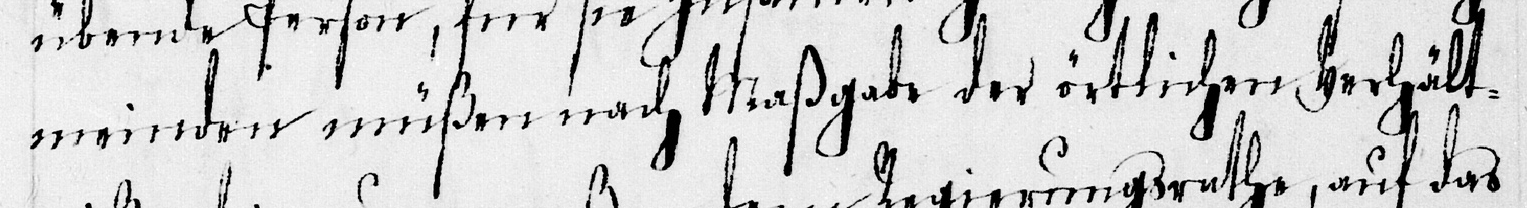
meinden müßen nach Maßgabe der örtlichen Verhält¬
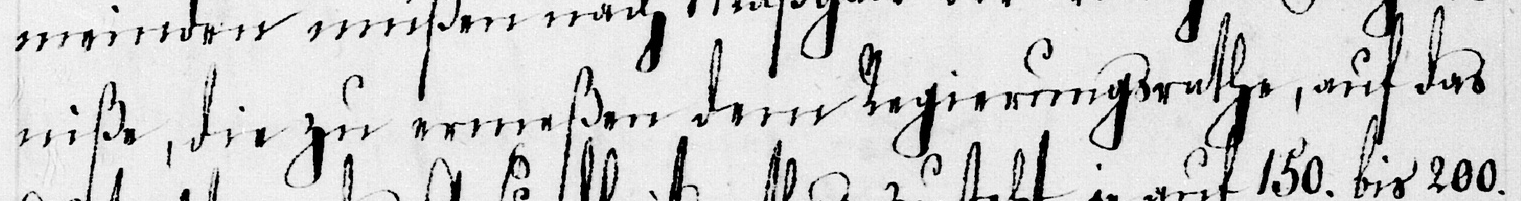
niße, die zu ermeßen dem Regierungsrathe, auf das
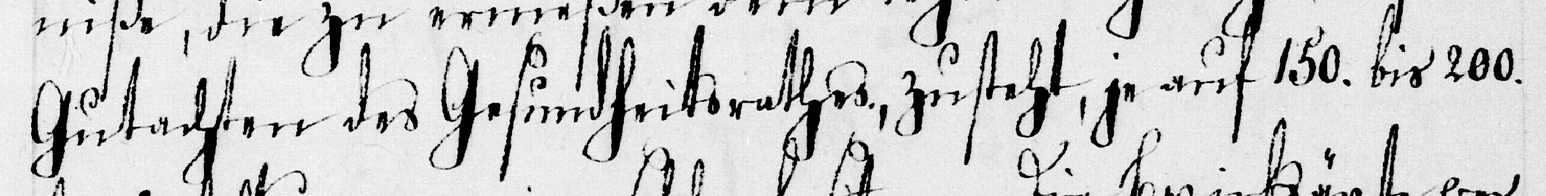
Gutachten des Gesundheitsrathes, zusteht, je auf 150. bis 200.
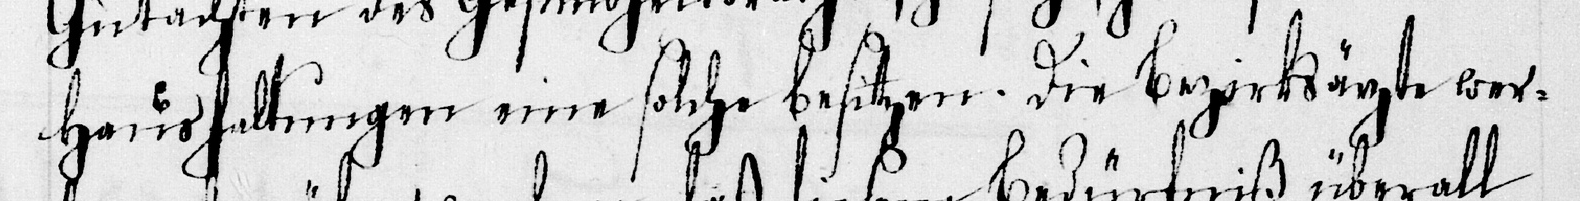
Haushaltungen eine solche besitzen. Die Bezirksärzte wer¬
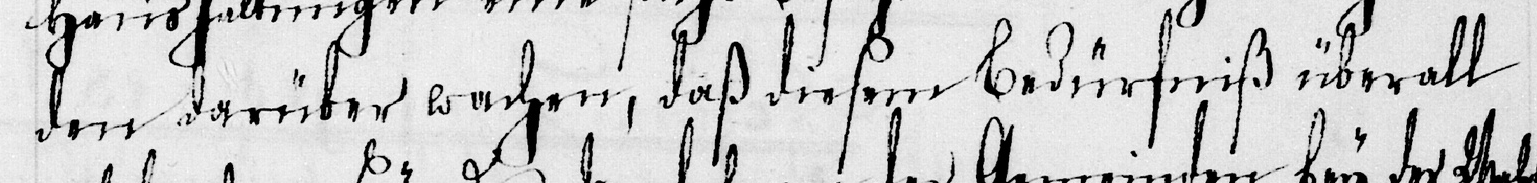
den darüber wachen, daß diesem Bedürfniß überall
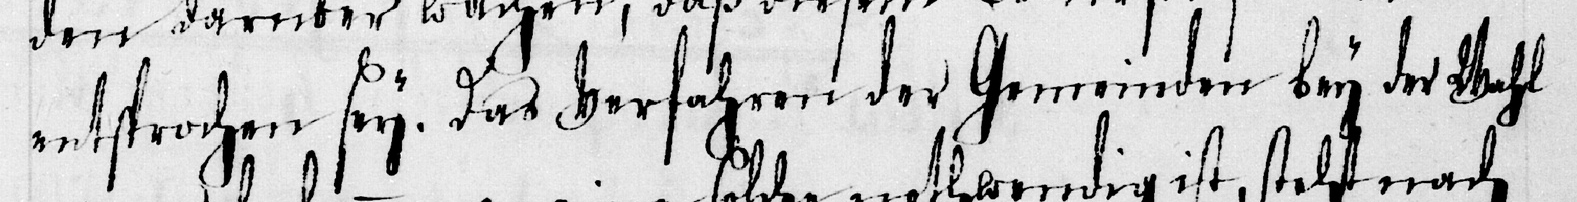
entsprochen sey. Das Verfahren der Gemeinden bey der Wahl
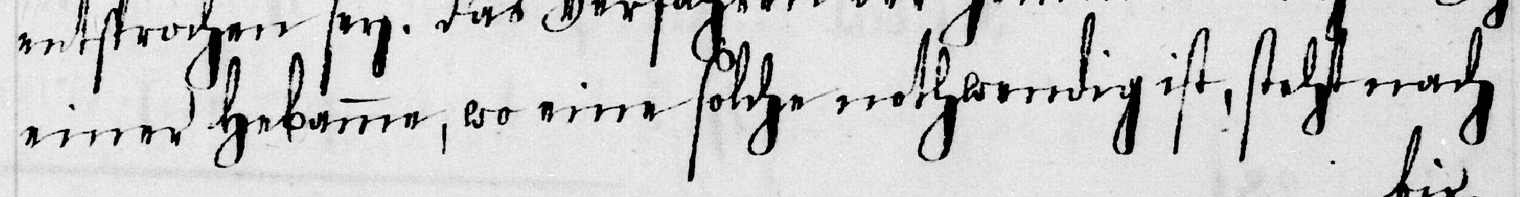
einer Hebamme, wo eine solche nothwendig ist, steht nach
